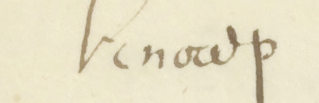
knaep
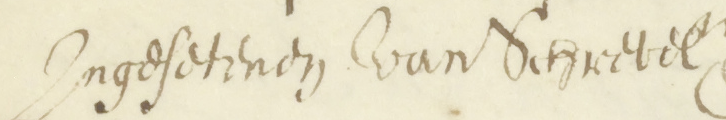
Ingesetenen van Schrevel
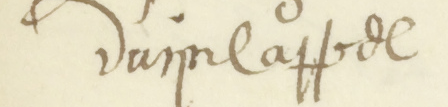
duijncappel
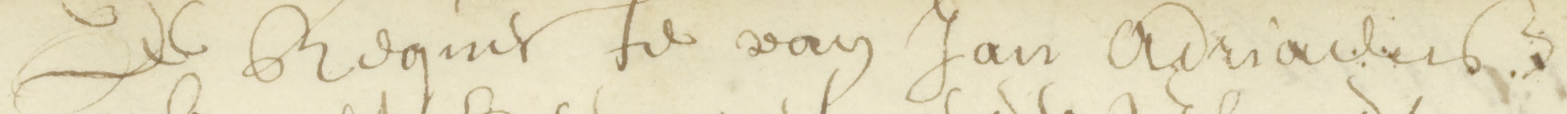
De Requeste van Jan Adriaens
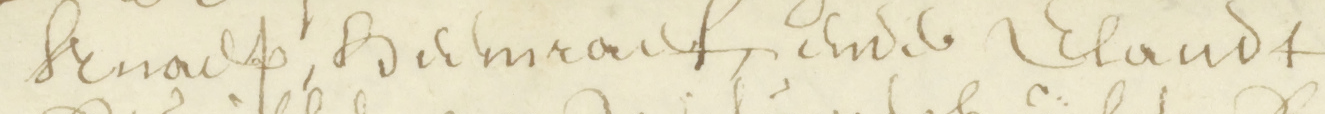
Knaep, Heemraet, ende Elandt
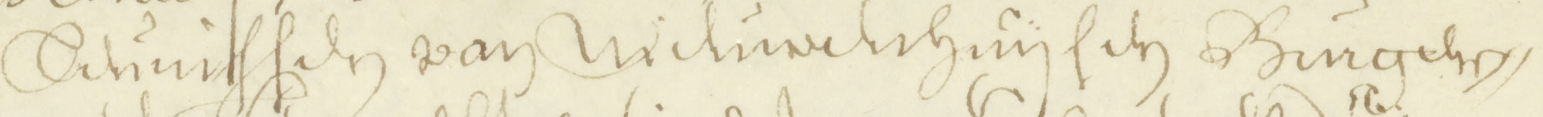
Teunissen van Nieuwenhuijsen Burger,,
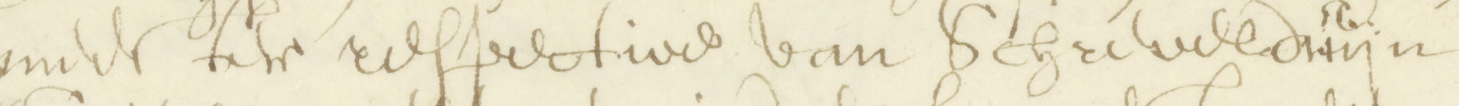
meester respective van Schrevelduijn
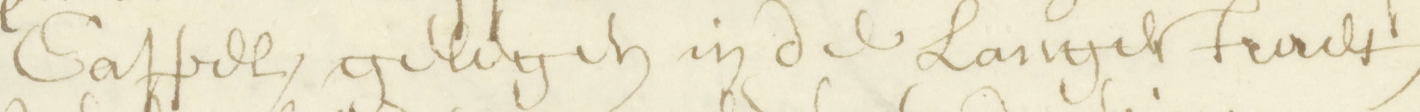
Cappel, gelegen in de Langestraet
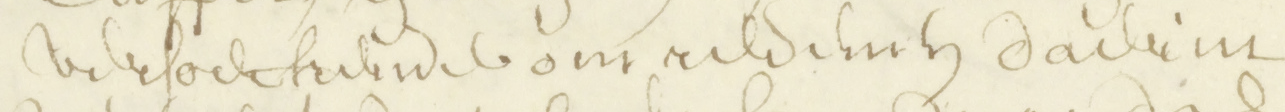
versoeckende om redenen daerin
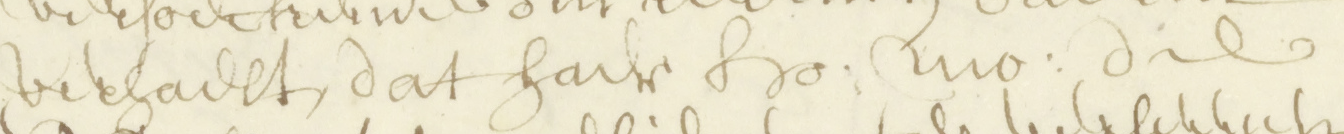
verhaelt, dat haer Ho:Mo: de
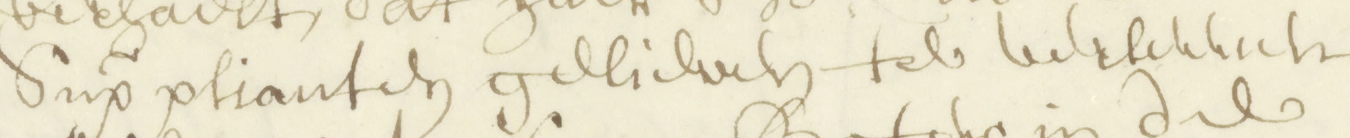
Supplianten gelieven te verleenen
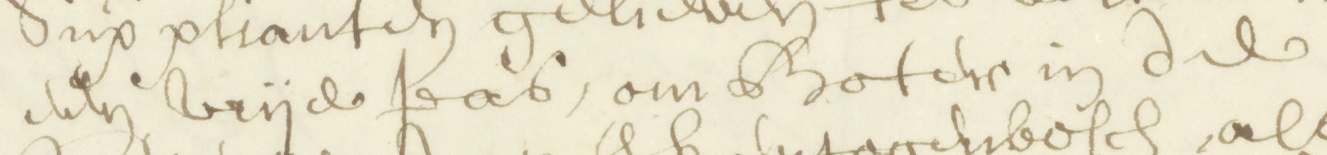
een vrije pas, om Boter in de
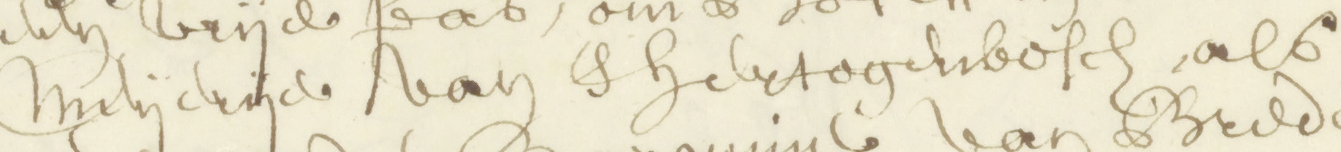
Meijerije van 's hertogenbosch, als
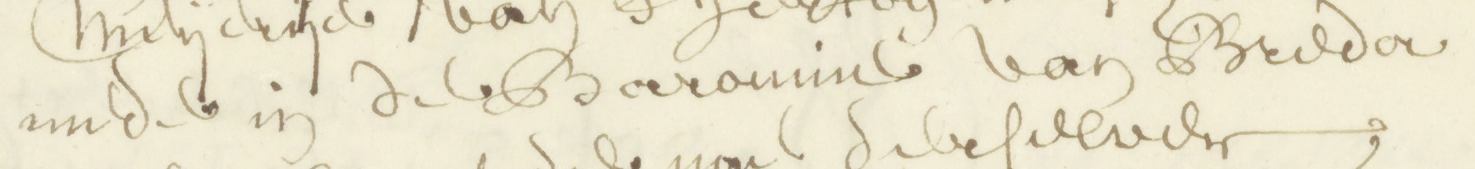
mede in de Baronine van Breda
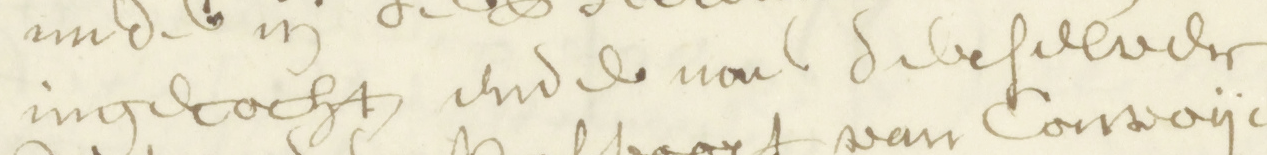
ingecocht, ende nae derselver
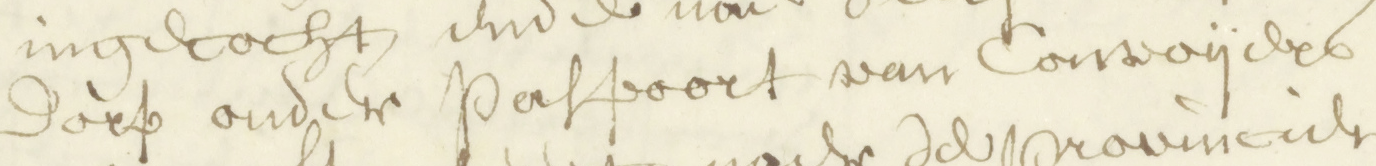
Dorp onder Paspoort van Convoijers
